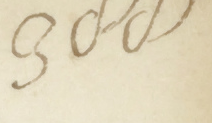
388
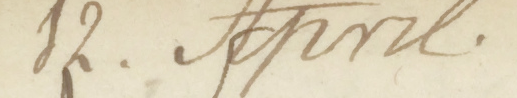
12. April.
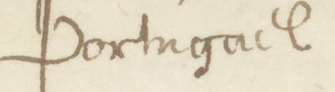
Portugael
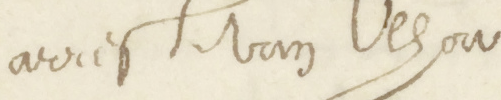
arreste van Ulhoa
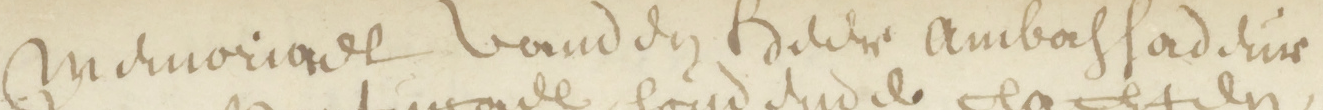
memoriael vanden Heer Ambassadeur
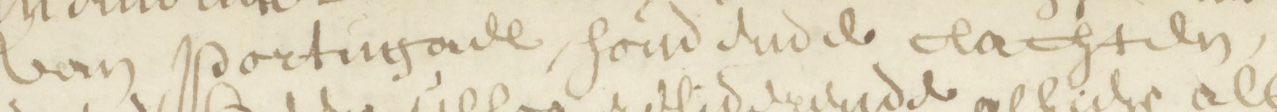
van Portugael, houdende clachten,
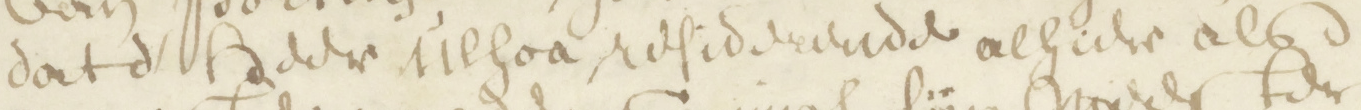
dat d'Heer Ulhoa residerende alhier als
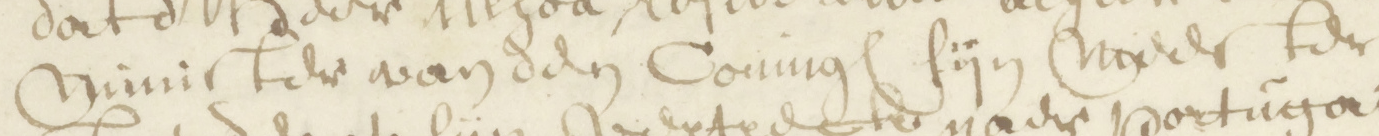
minister van den Coningh sijn meester
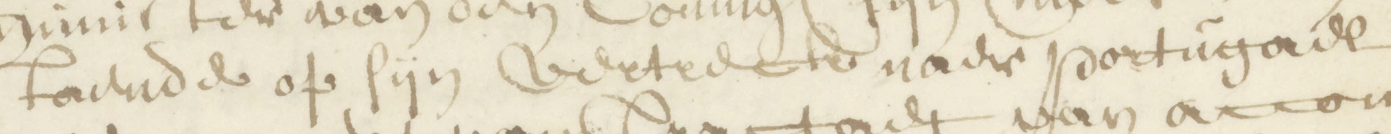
staende op sijn vertreck naer Portugael
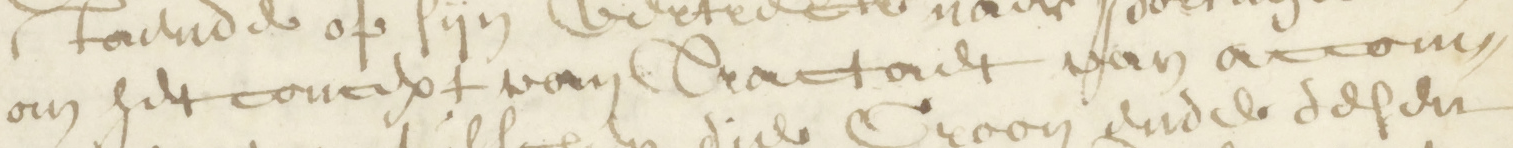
om het concept van Tractaet van accom„
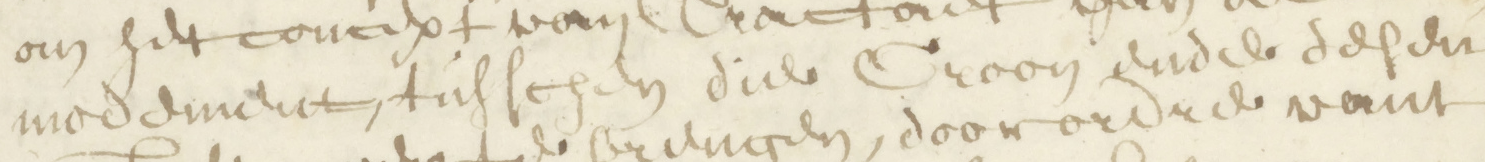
modement, tusschen die Croon ende desen
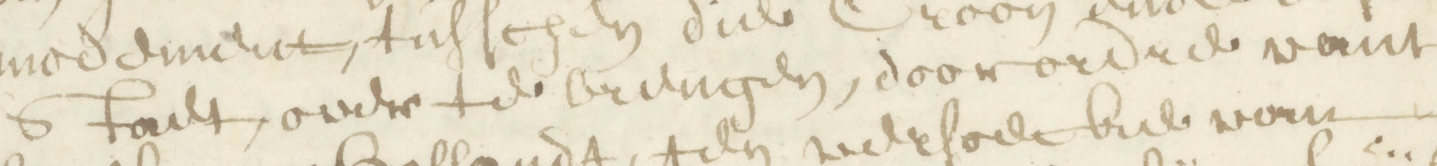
Staet, over te brengen, door ordre vant
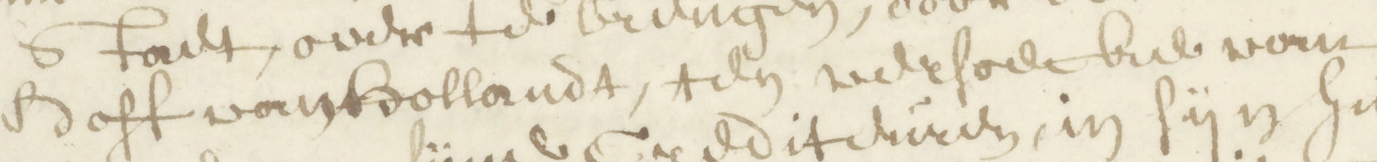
Hoff van Hollandt, ten versoecke van
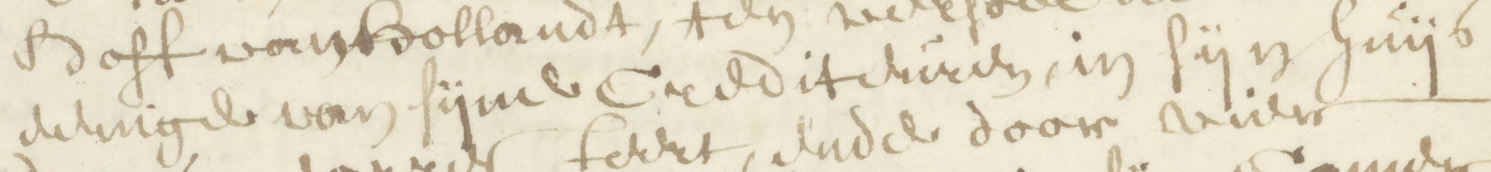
eenige van sijne Crediteuren, in sijn huijs
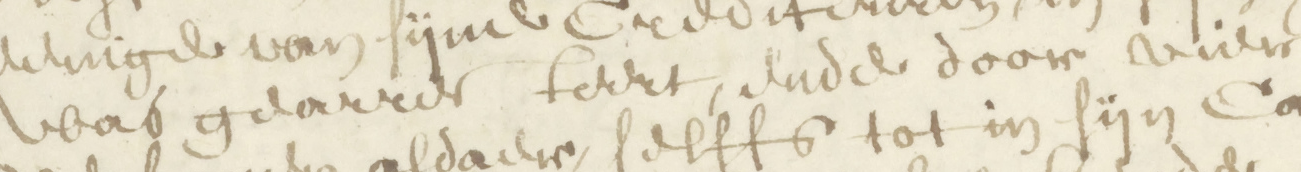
was gearresteert, ende door vier
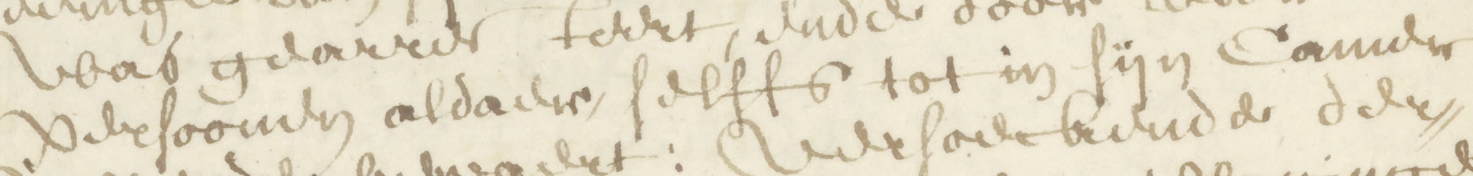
persoonen aldaer, selffs tot in sijn Camer
